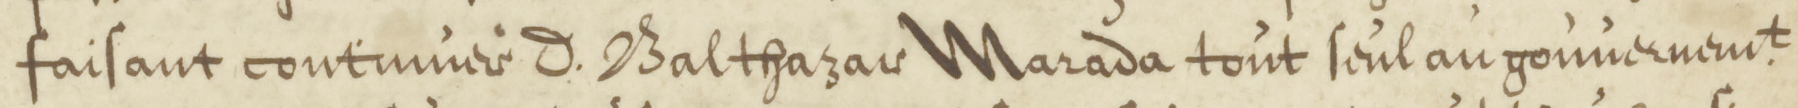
faisant continuer D. Balthazar Marada tout seul au gouvernemt.
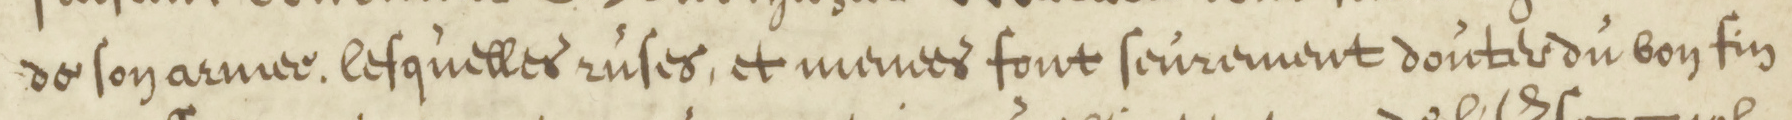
de son armee. lesquelles ruses, et menees font seurement douter du bon fin
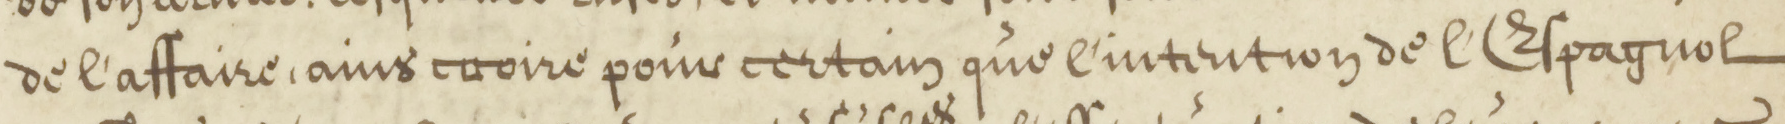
de l‛affaire, auis croire pour certain que l‛intention de l‛Espagnol
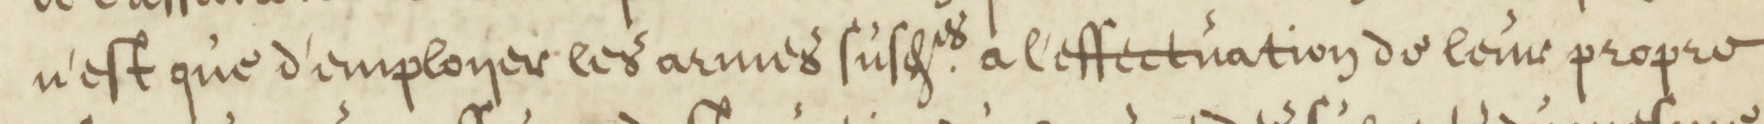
n‛est que d‛employer les armes susds. a l‛effectuation de leur propre
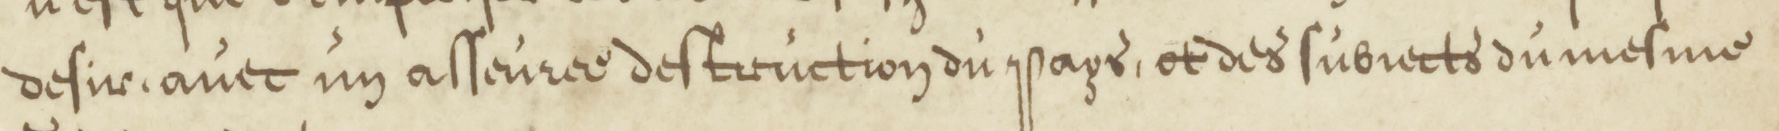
desir, auec un asseuree destruction du pays, et des subiects du mesme
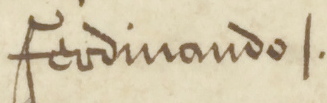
Ferdinando.
